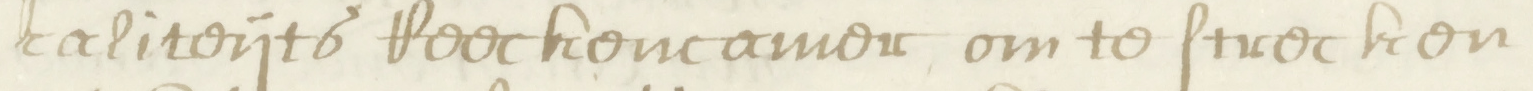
raliteijts Reeckencamer, om te strecken
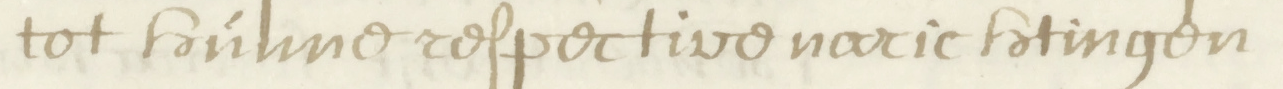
tot hunne respective narichtingen.
